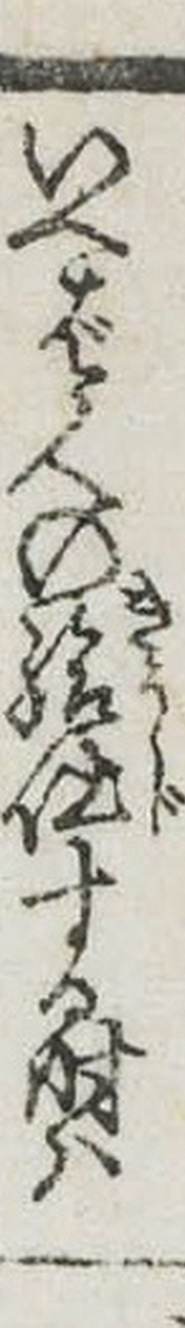いへば人の給仕する時は
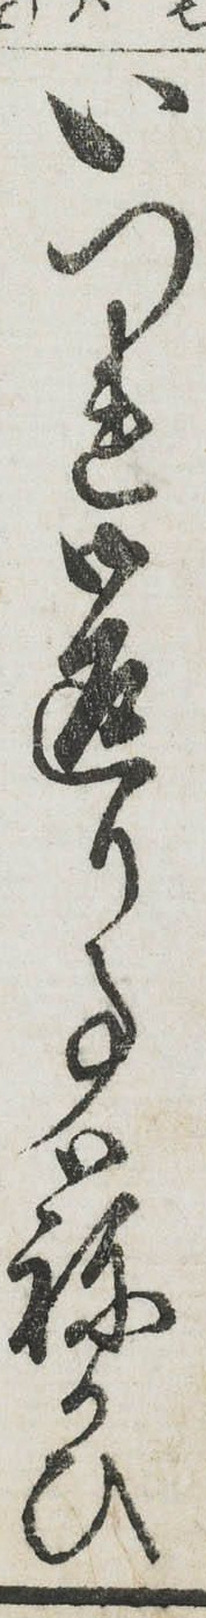いつれ御返り事御ねかひ
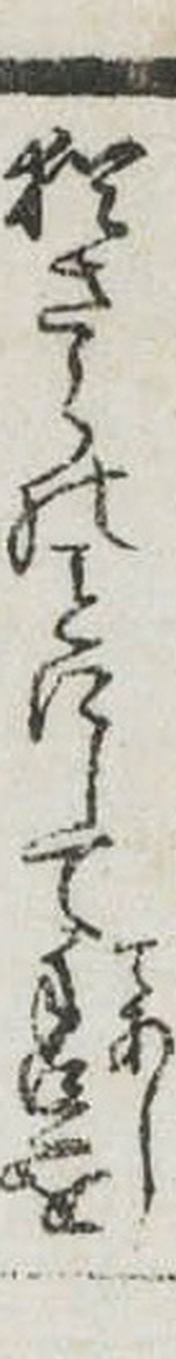猶さらのことにして手足を
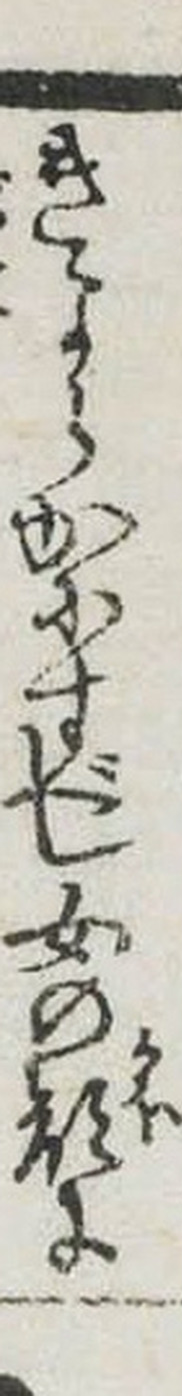きよらかにすべし女の顔に
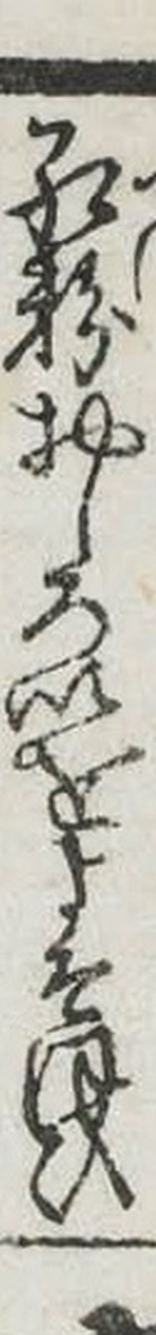紅粉おしろいをよそほひ
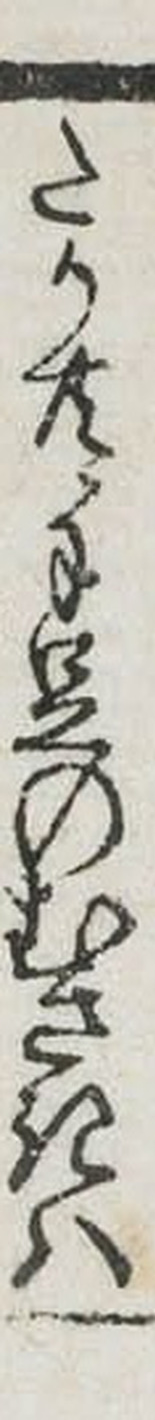たり共手足のむさきは
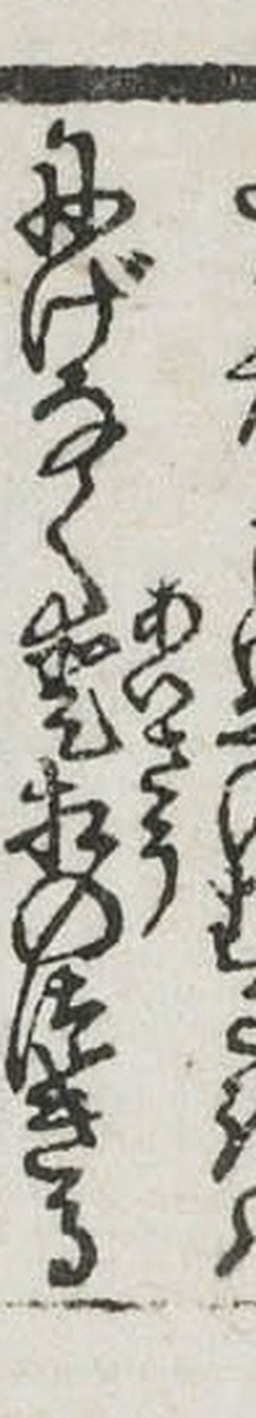にげなく愛相のつきる
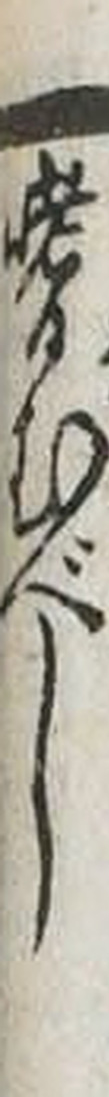嗜むべし
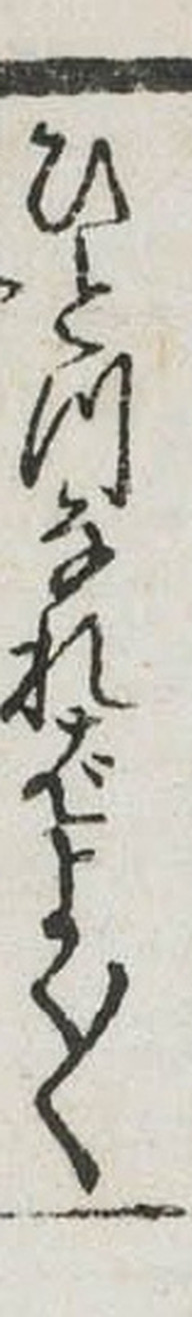ひとつなればよく〳〵
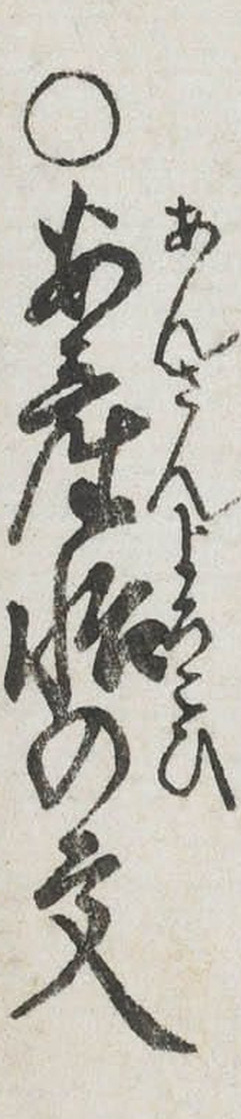○安産怡の文
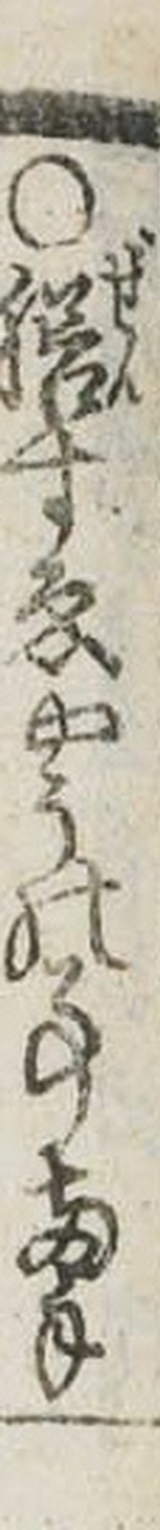○膳すゑやうの事両手
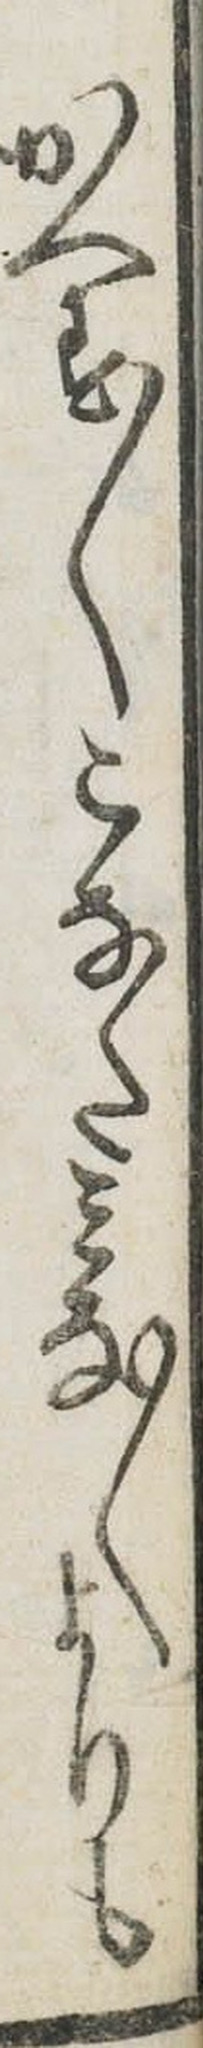かへす〳〵こなたみな〳〵よりも
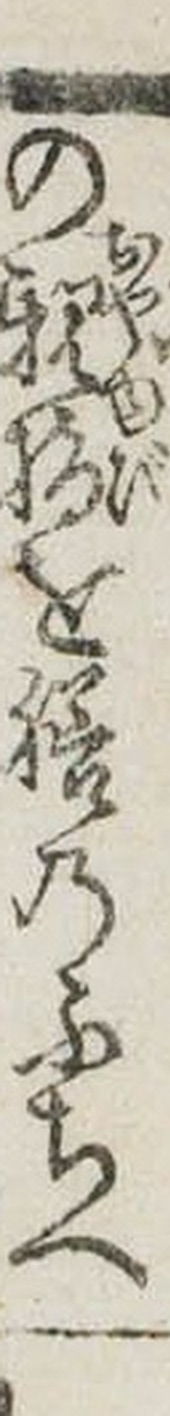の親指を膳のふちへ
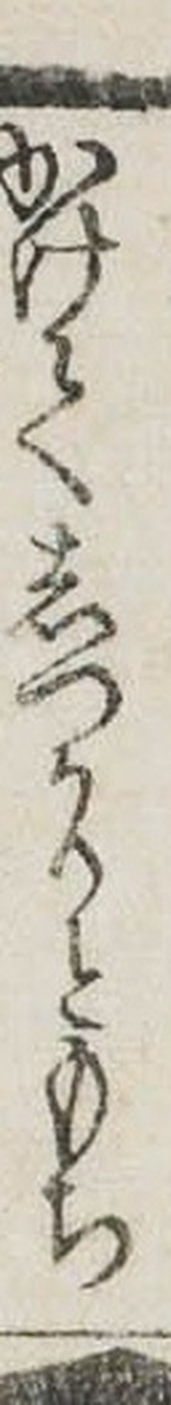かけてしつかりともち
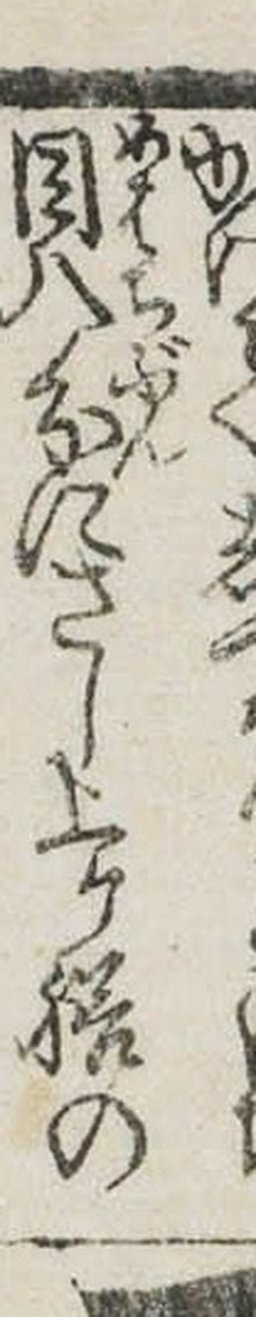目八分にさし上け膳の
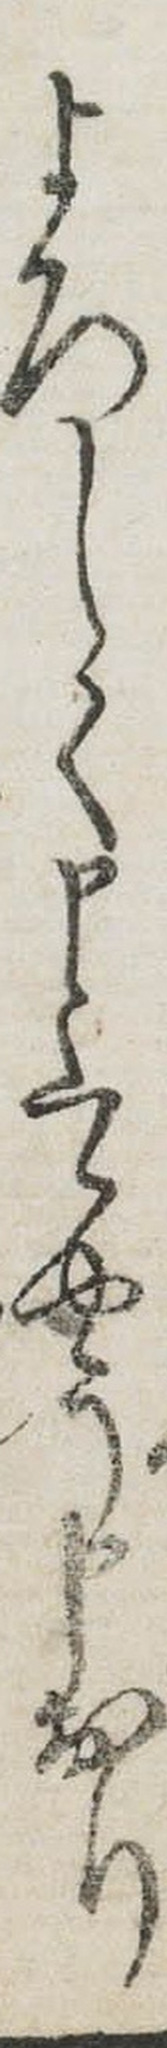よろしく申上候やう申おり
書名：頭書萬用婦人手紙之文言
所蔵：東京学芸大学教育コンテンツアーカイブ
